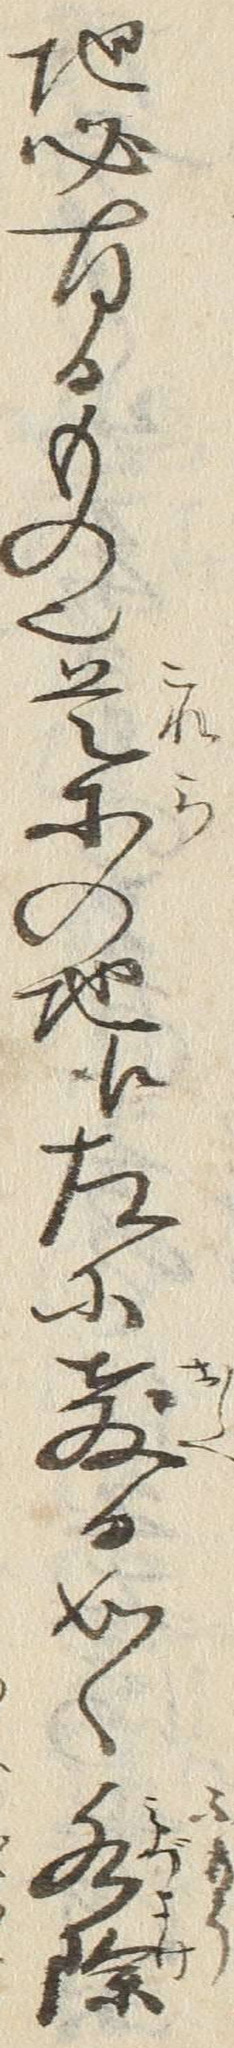地必有るもの也是等の地江左尓教る如く水除
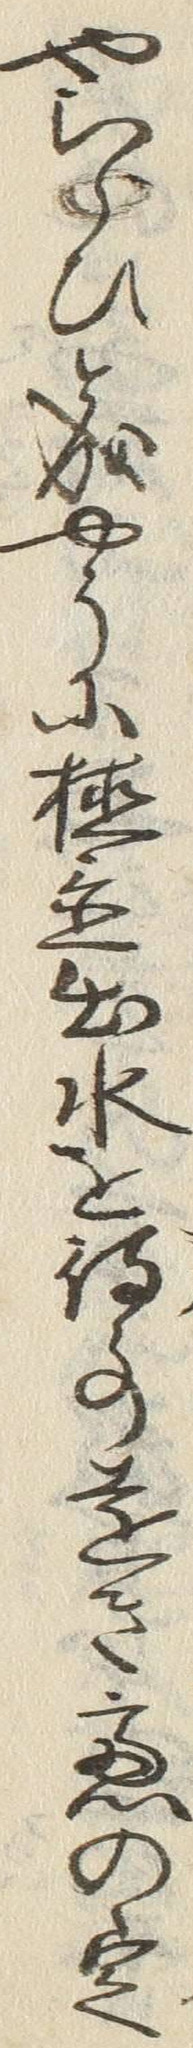やらひと成やう尓植置出水を待事遠き慮の定
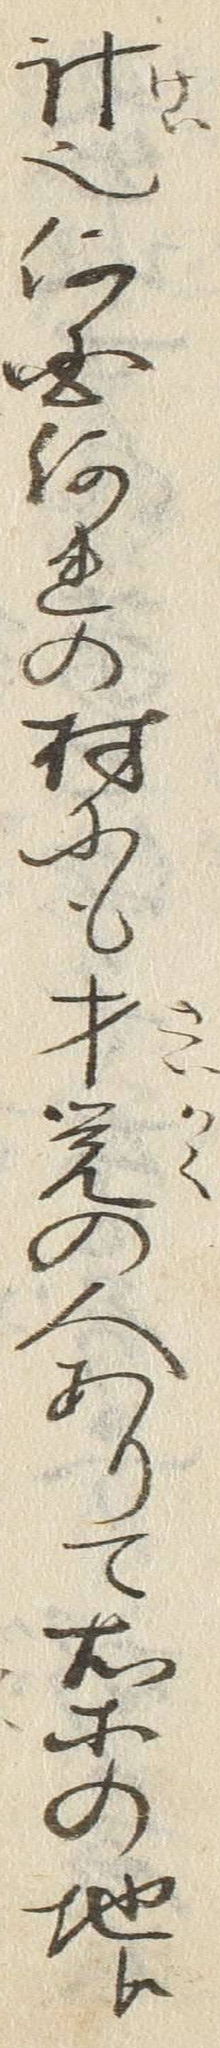計也何國何連の村尓も才覚の人ありて右等の地江
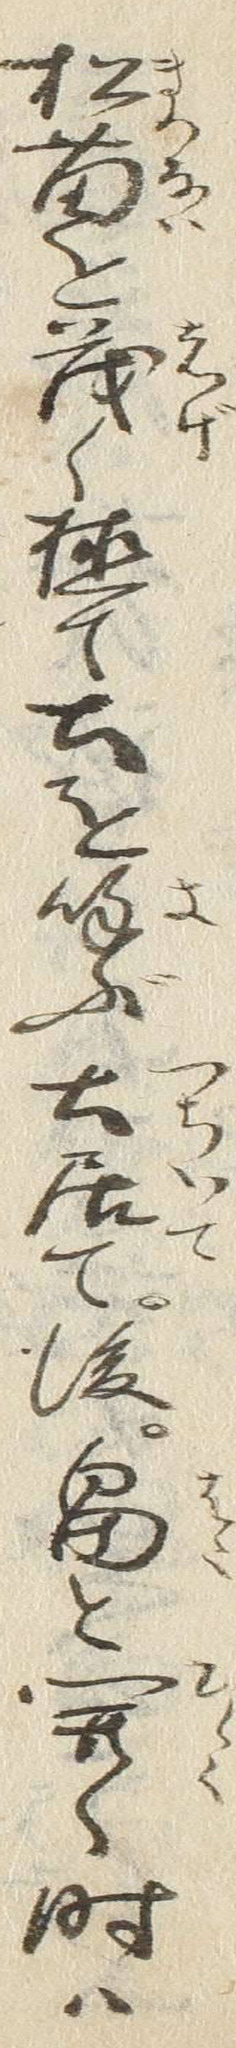松苗を茂く植て土を呼ぶ土居て。後。畠と開く時は
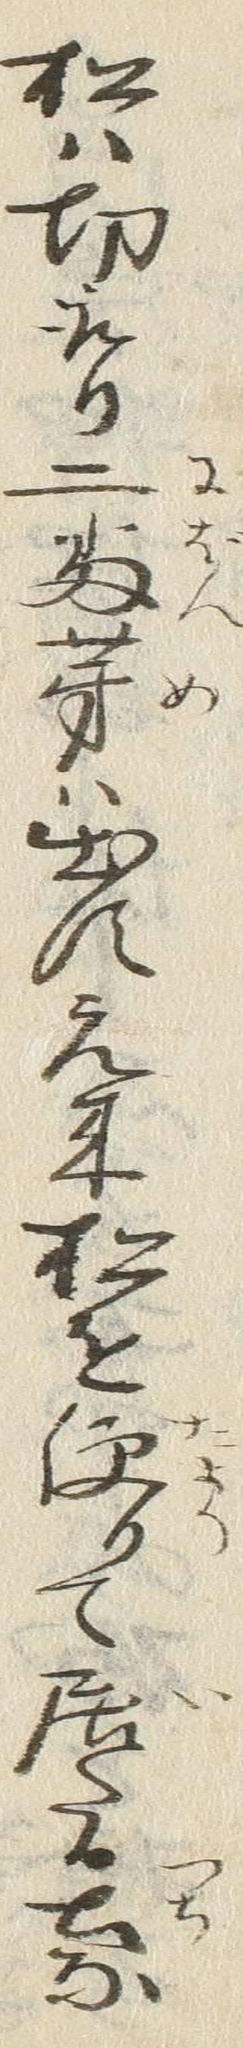松は切取り二番芽は出須元来松を便りて居たる土な
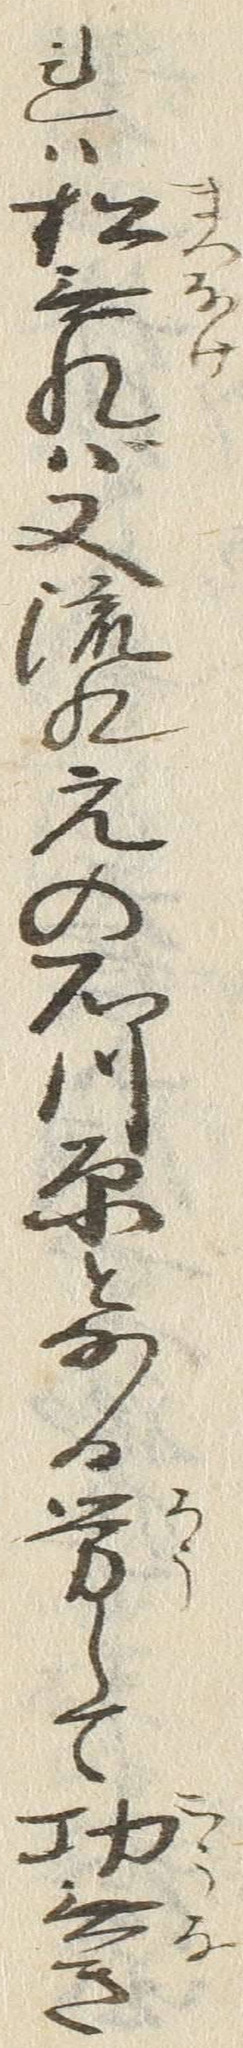連は松無れば又流れ元の石川原となる労して功無き
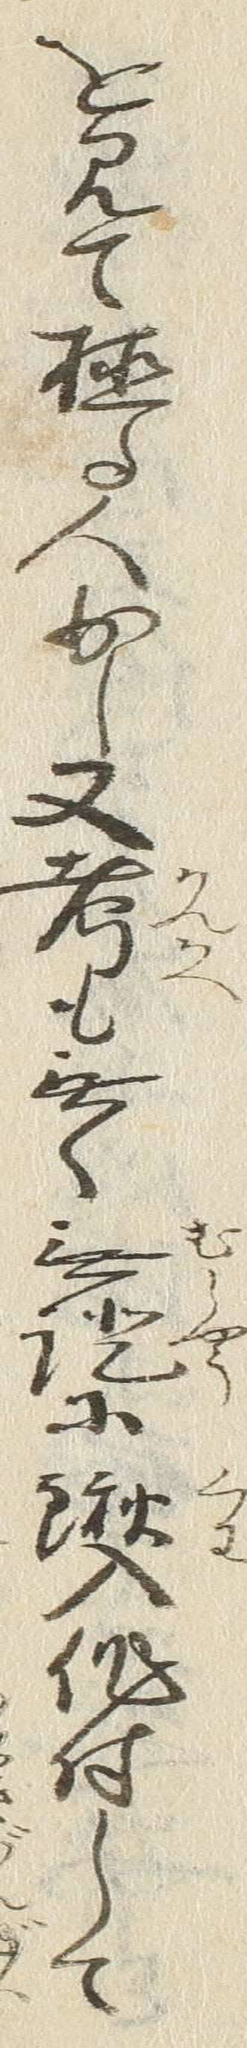を見て植る人少し又考も無く無證尓鍬入作付して
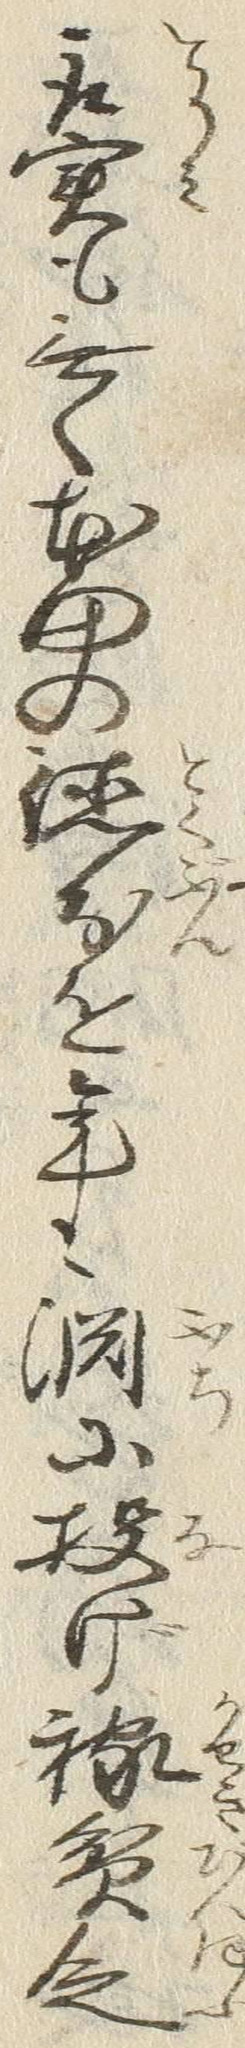取実も無く本田の徳分を年々淵尓投げ稼貧乏
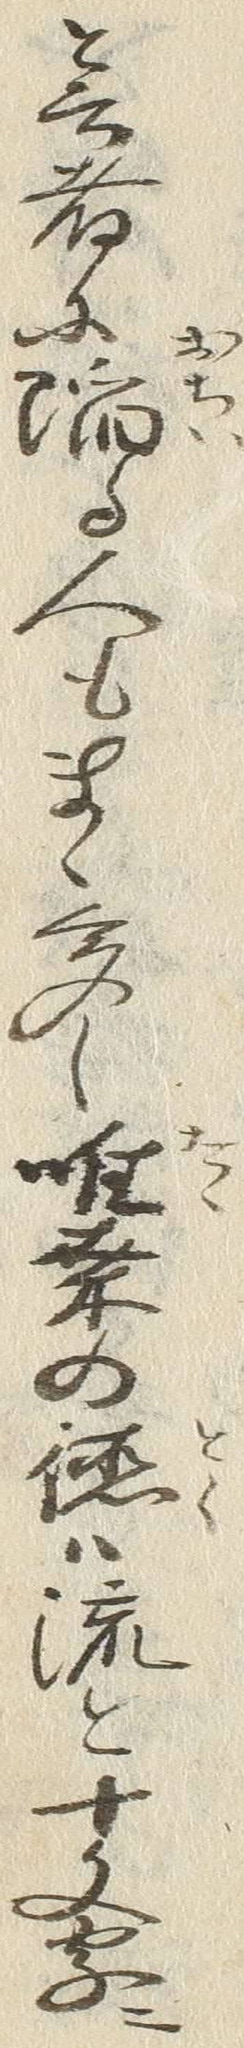と云者尓陥る人もまゝ多し唯桑の徳は流と十文字に
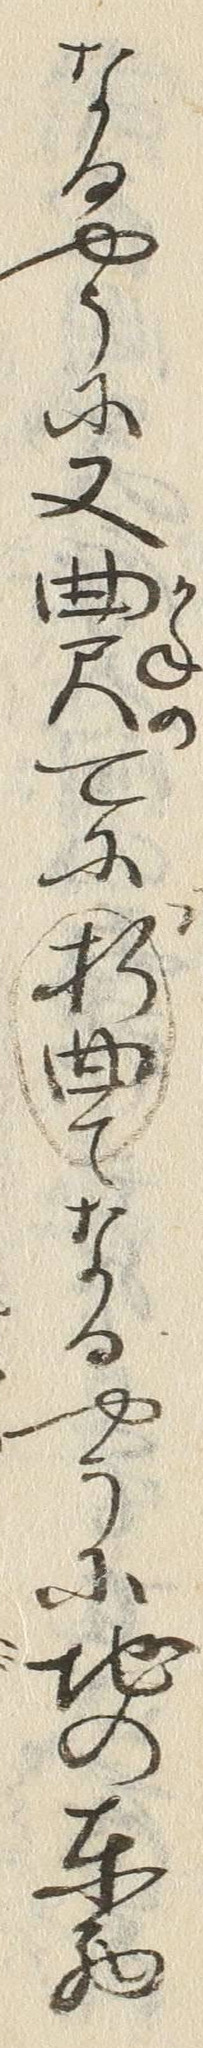なるやう尓又曲尺て尓水よけてなるやう尓地の東西
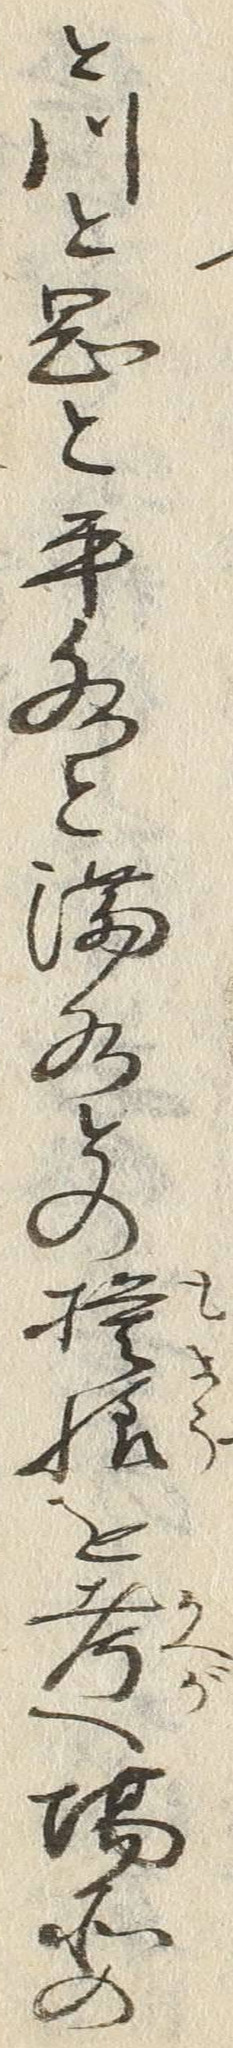と川と岡と平水と満水との模様を考へ場所の
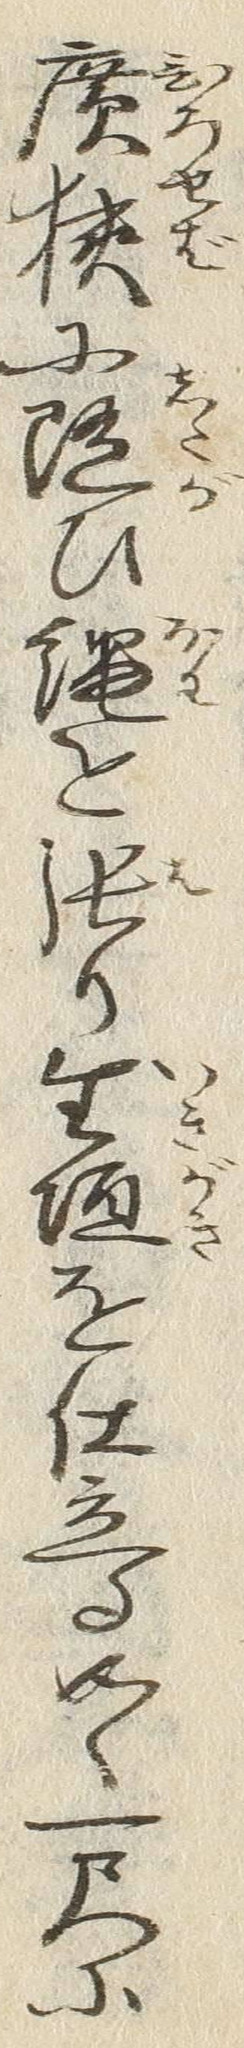廣狭尓随ひ縄を張り生垣を仕立る如く一尺尓
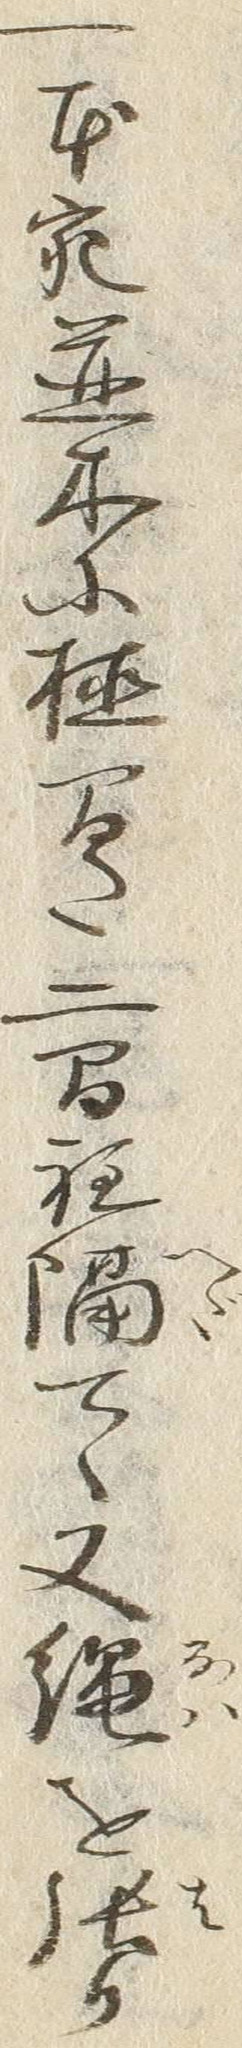一本宛並木尓植間た二間程隔てゝ又縄を張り
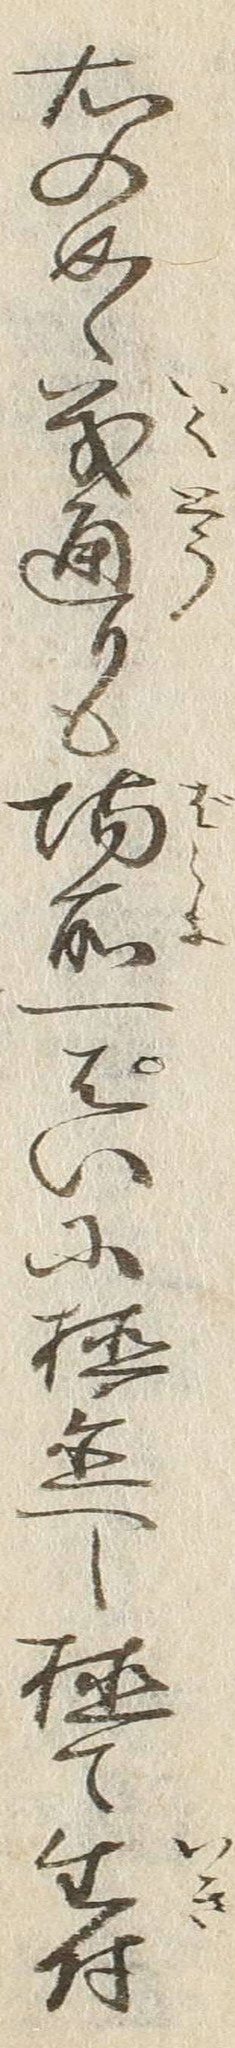右の如く幾通りも場所一ぱい尓植置へし植て生付
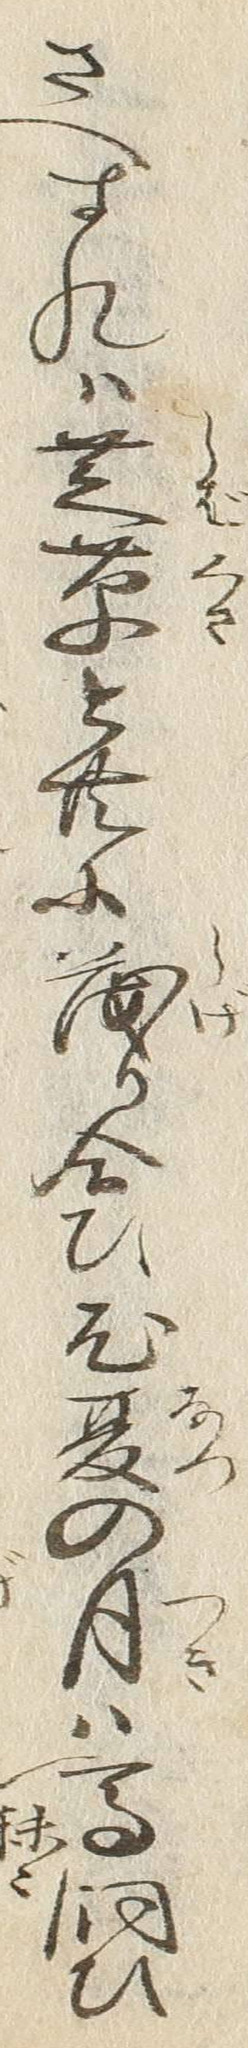せへすれは芝草と共尓茂り合ひ尤夏の月は馬飼ひ
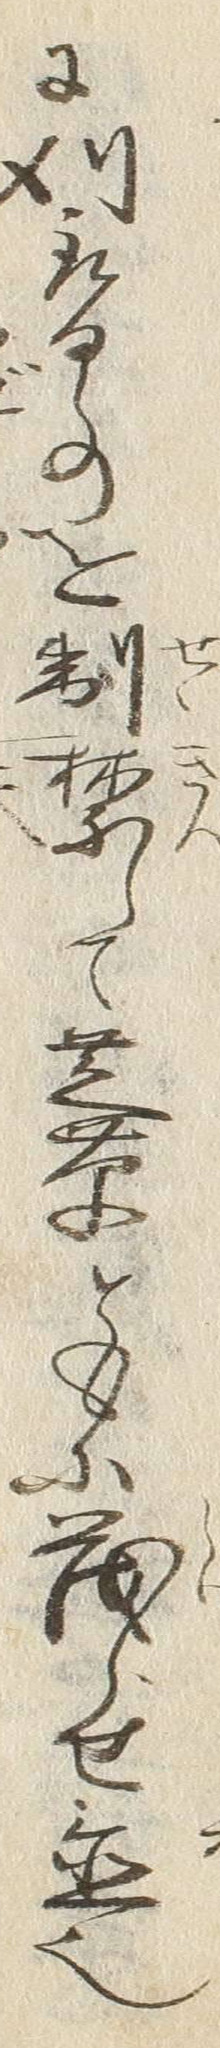尓刈取る亊を制禁して芝草とも尓茂らせ置也
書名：養蠶實驗録後編
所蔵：東京大学農学生命科学図書館 国文学研究資料館
